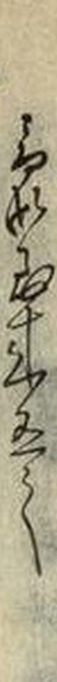ニ而御到来有之
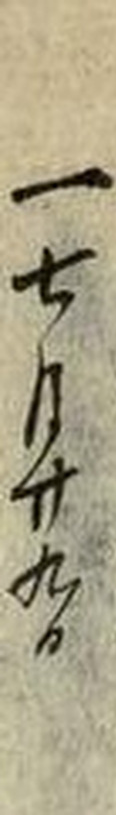一七月廿九日
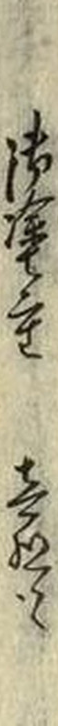御塗重壱組ツヽ
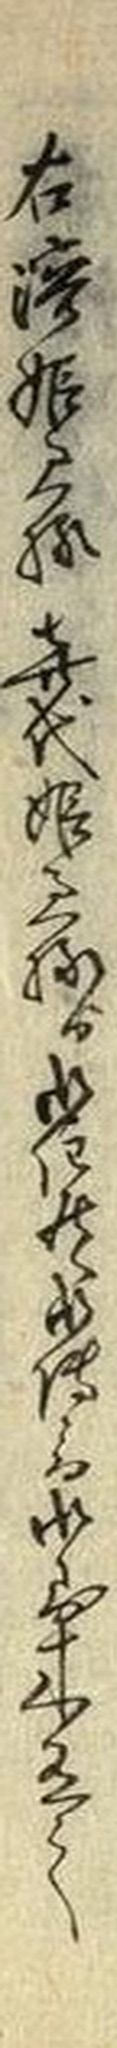右溶姫君様喜代姫君様ゟ御住居御伝ニ而御到来有之
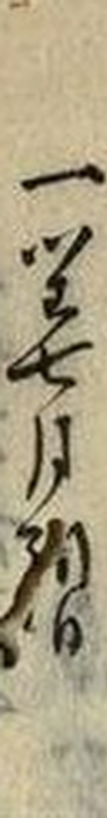一閏七月朔日
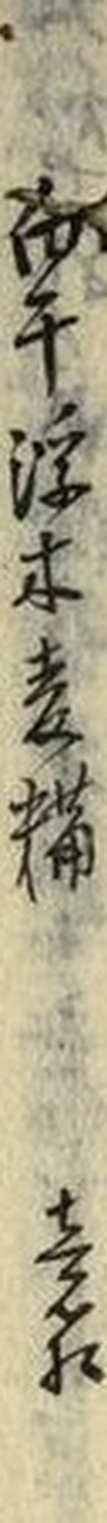白干浮木麦糒壱箱
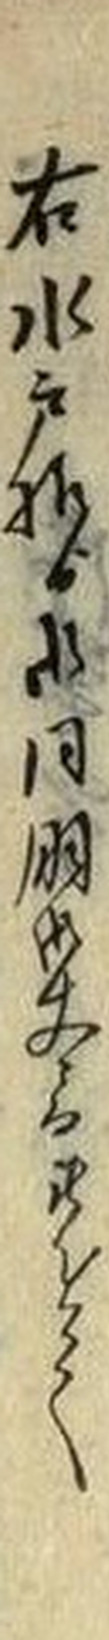右水戸様ゟ御同朋御使ニ而被進之
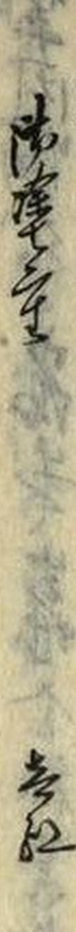御塗重壱組

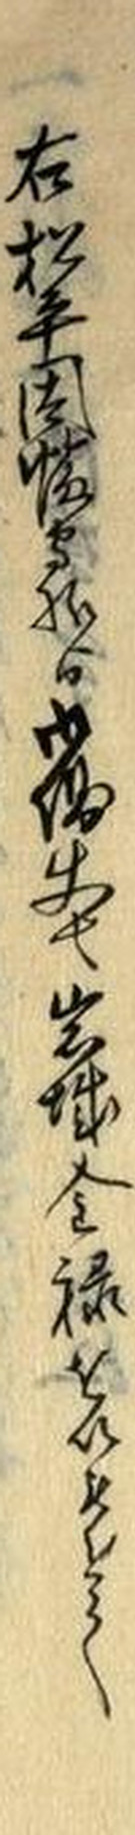右松平因幡守様ゟ御側使者岩城金禄を以被進之
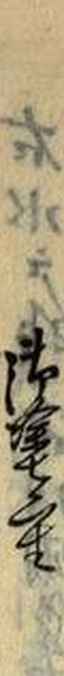御塗重
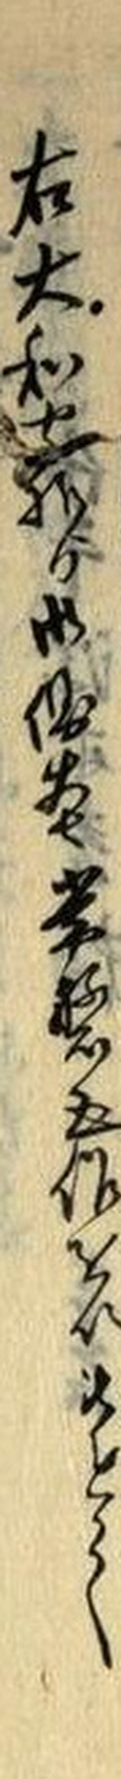右大和守様ゟ御側使者常磐五作を以被進之
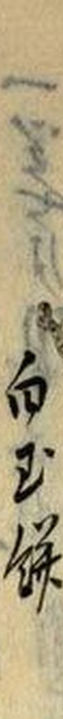白玉餅
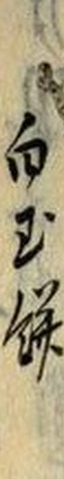白玉餅
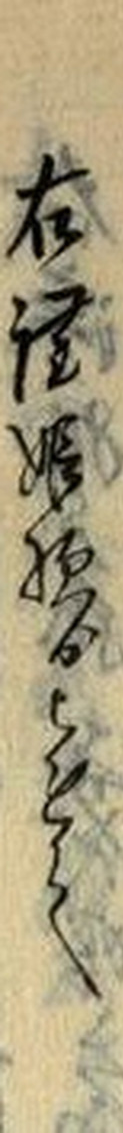右謹姫様ゟ被進之
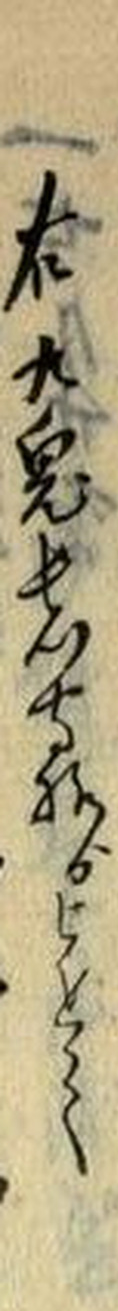右九鬼長門守様ゟ被進之
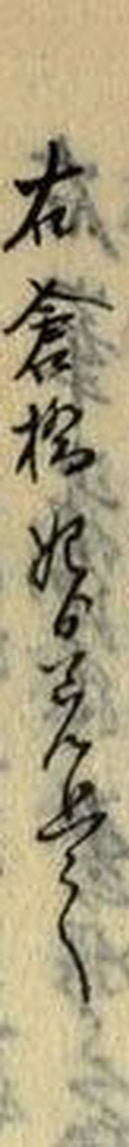右倉橋始ゟ差上之
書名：少傅日録抄（斉承付側向頭取日記、在府）
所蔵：福井県文書館 Fukui Prefectural Archives
